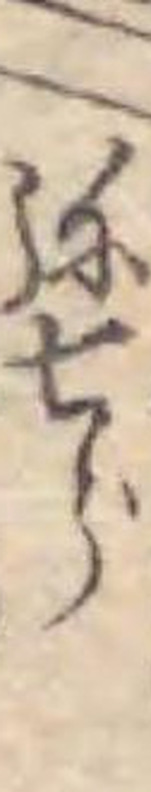弥七郎
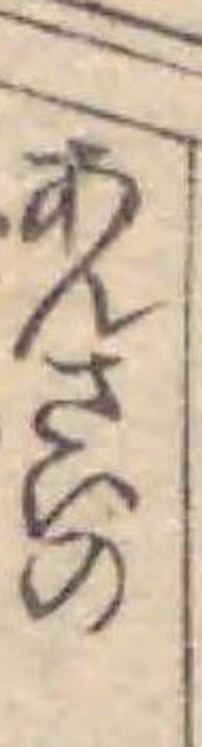あんさいの
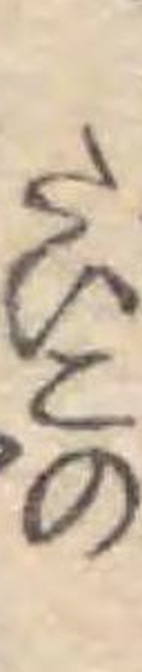たいこの
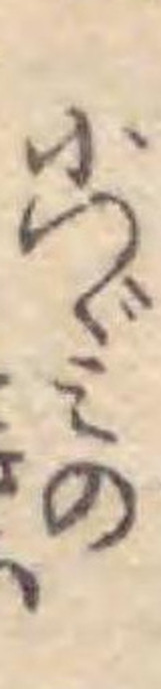小つゞみの
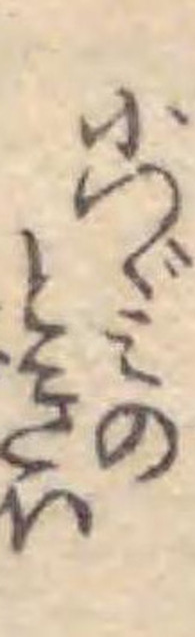小つゞみの
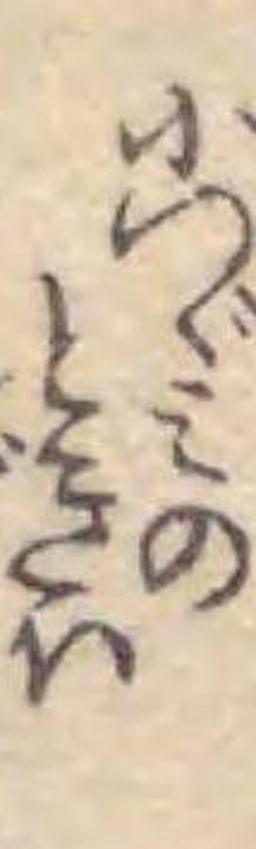ときは
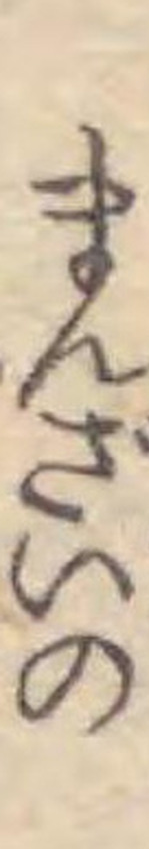まんざいの
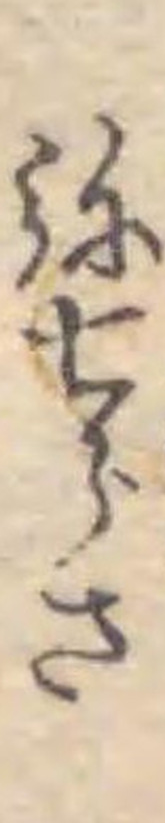弥七郎さ
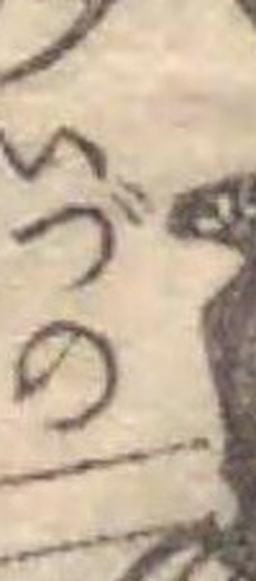いづの
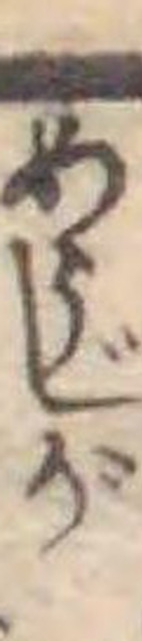めうじが
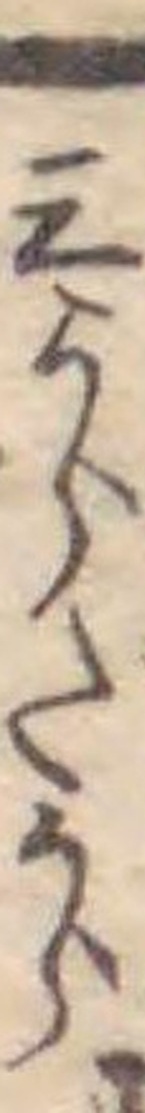三郎だから
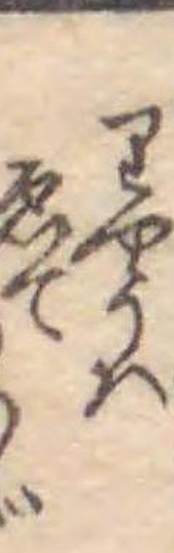りやうは
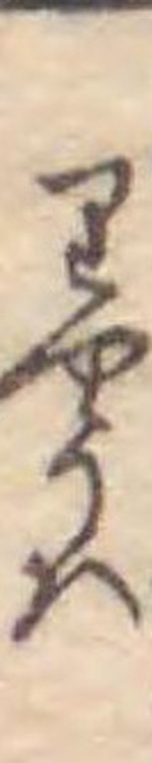りやうは

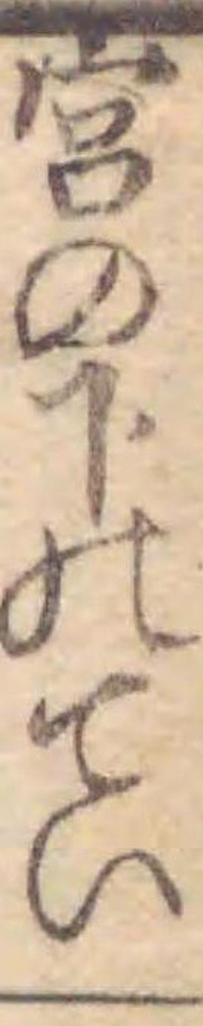宮の下のてい
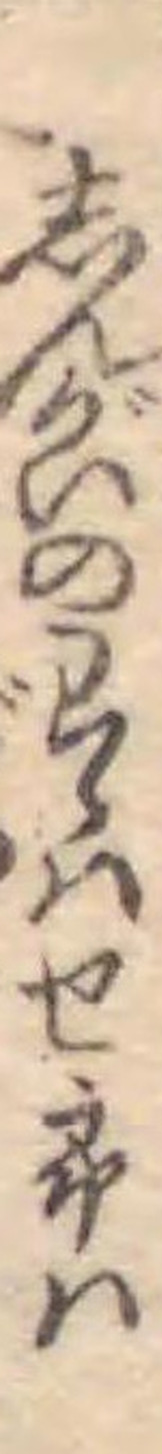しんがいのわらはせ郎は
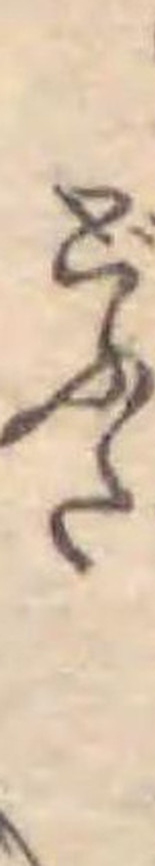どふた
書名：文武二道万石通 : 3巻
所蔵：国立国会図書館 National Diet Library, JAPAN
